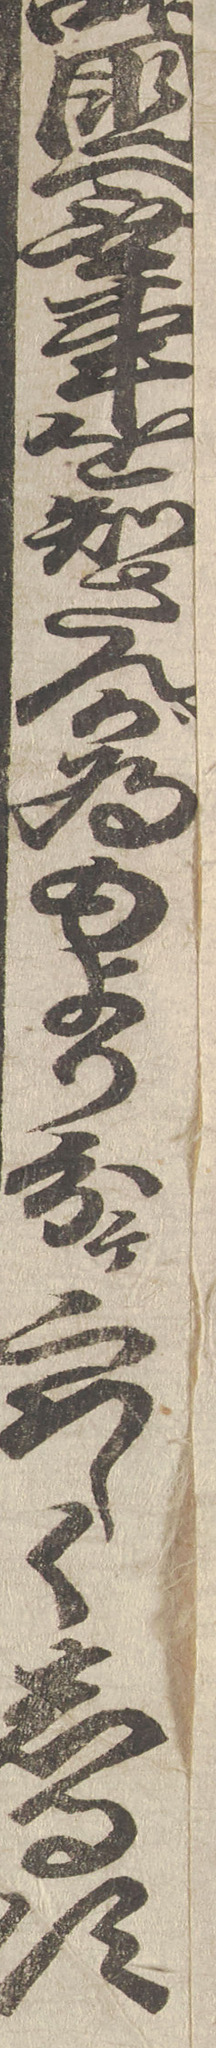諸國へ無事を知さんが為もより分ケくわしくしるす
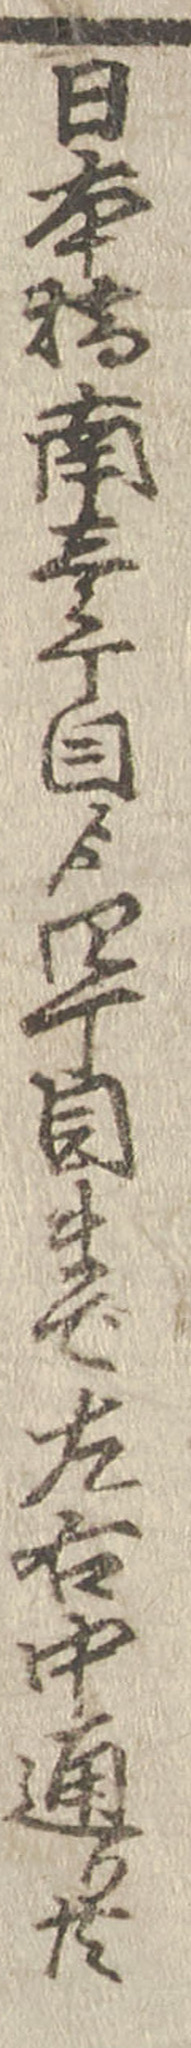日本橋南壱丁目ゟ四丁目まで左右中通り共
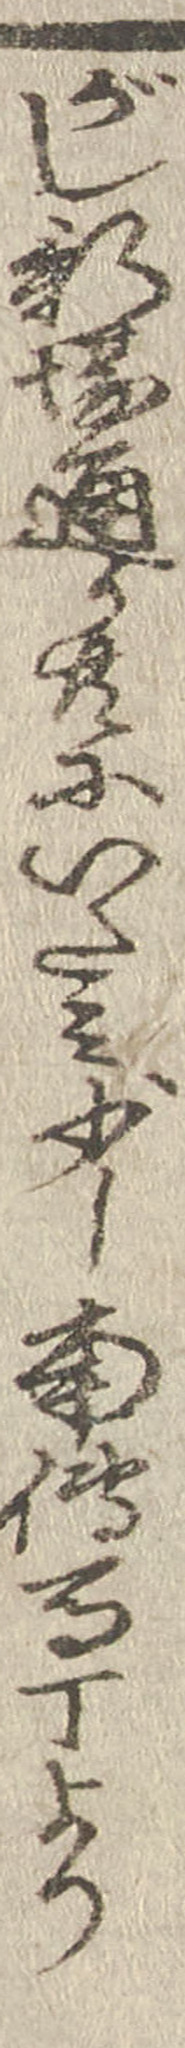がし新堀通り共にいたミ少し南傳馬丁より
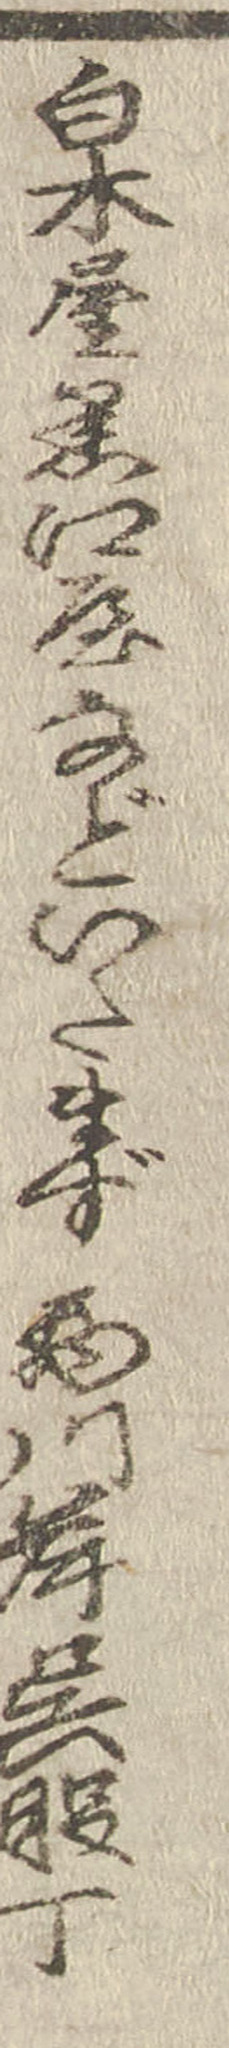白木屋黒江屋などいたまず西川岸呉服丁
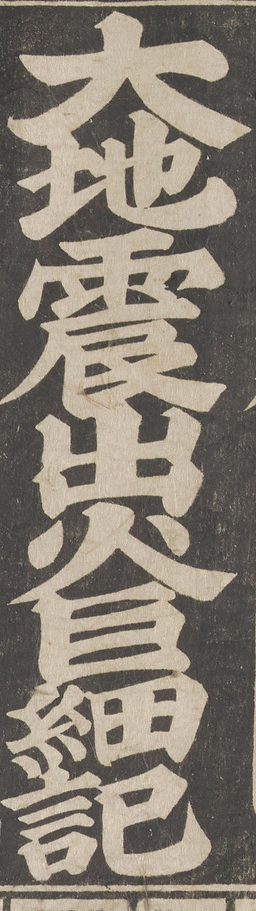大地震出火巨細記
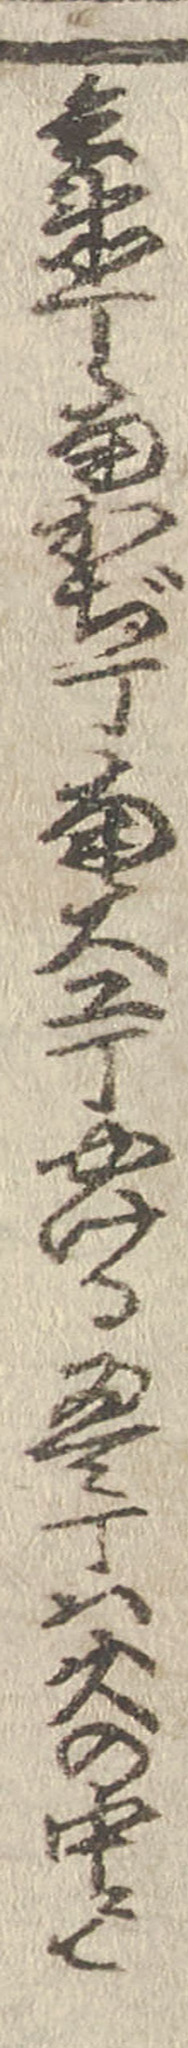兵衛丁南かぢ丁南大工丁やける畳丁ハ火の中ニて
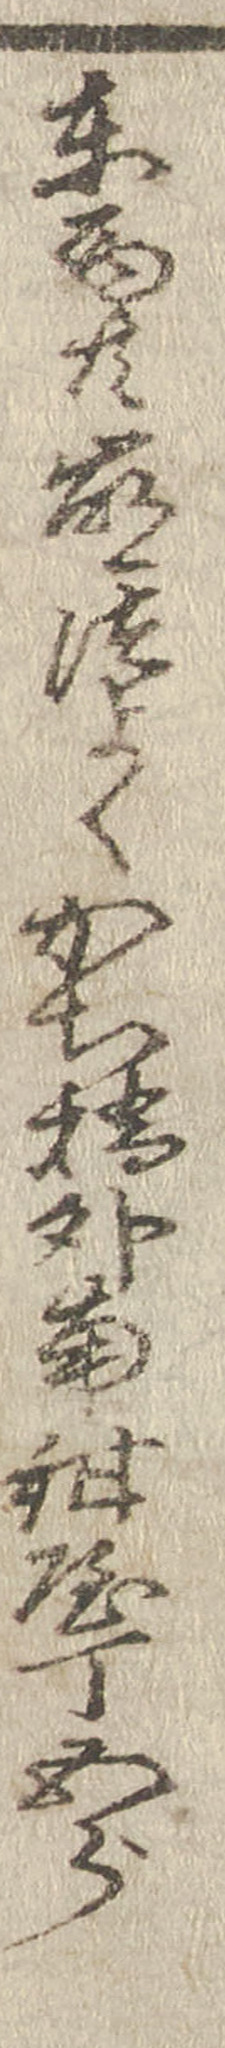東西共崩つよくかち橋外南紺屋丁五郎
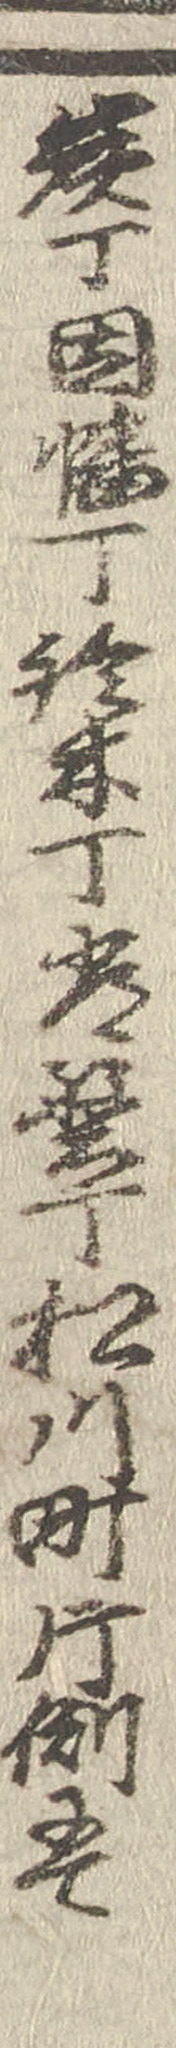炭丁因幡丁鈴木丁常磐丁松川町片側にて
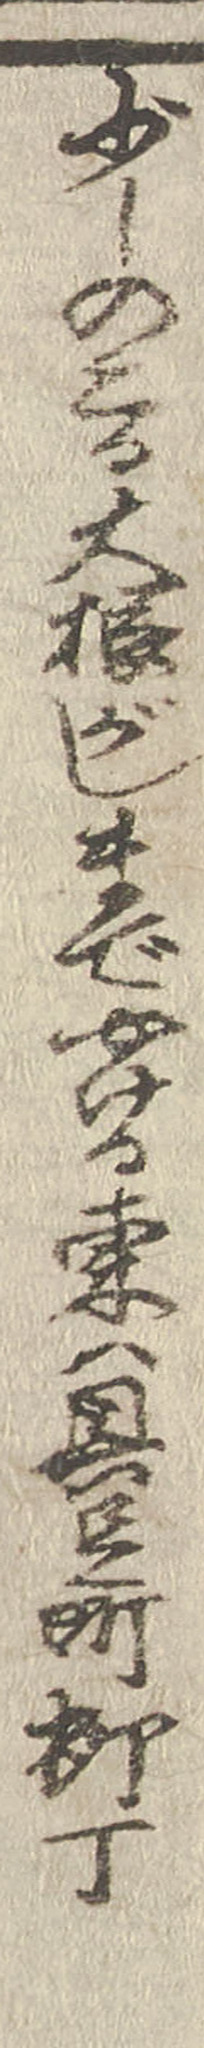少しのこる大根がしまでやける東ハ具足町柳丁
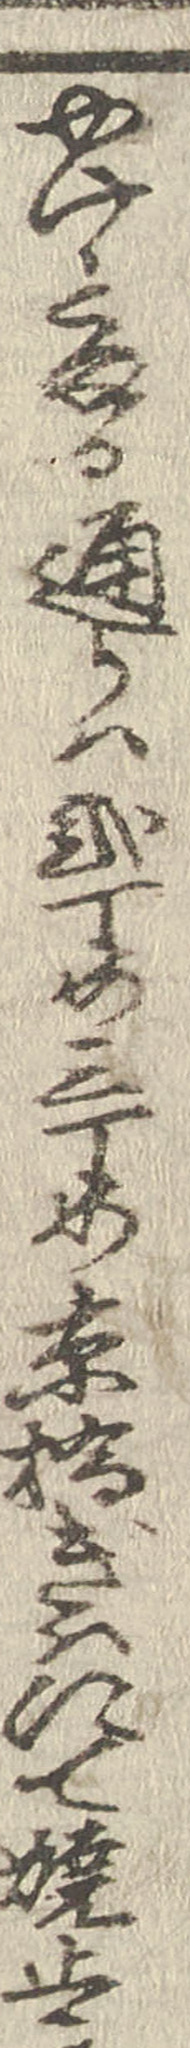やけとまる通りハ弐丁め三丁め京橋ぎハにて焼止る
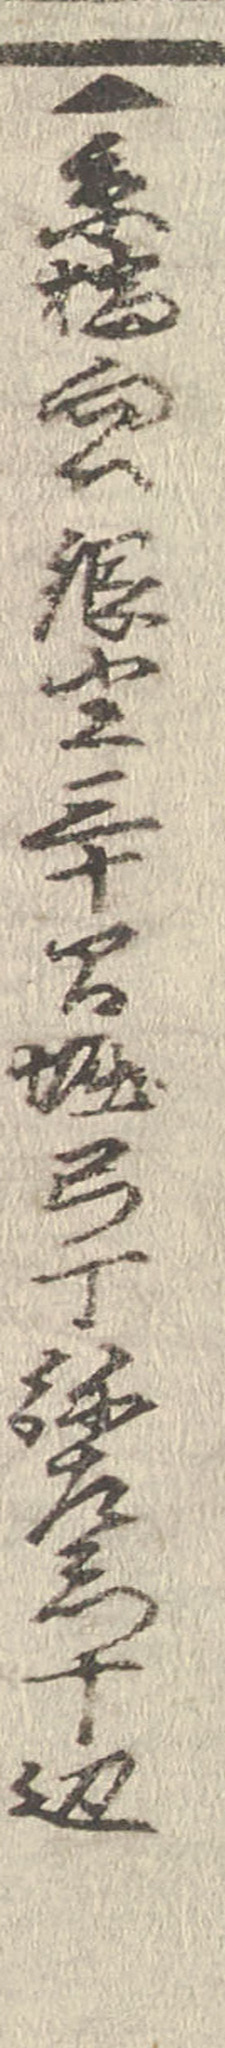▲京橋向ハ銀坐三十間堀弓丁弥左衛門丁辺
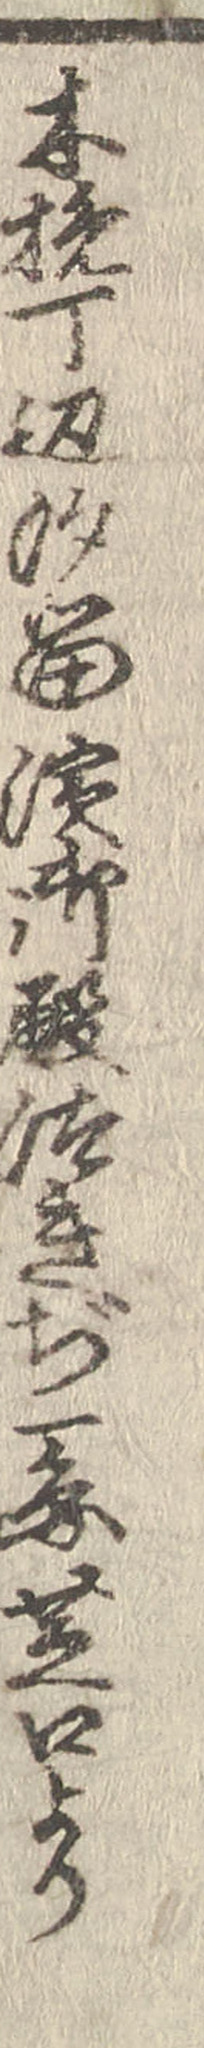木挽丁辺汐留濱御殿つきぢ一圓芝口より
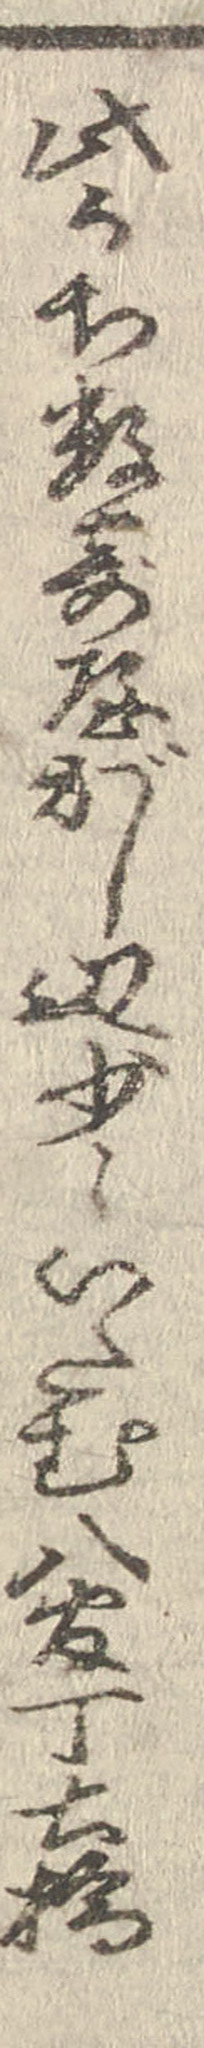此うち数寄屋がし辺少しいたむ八間丁土橋
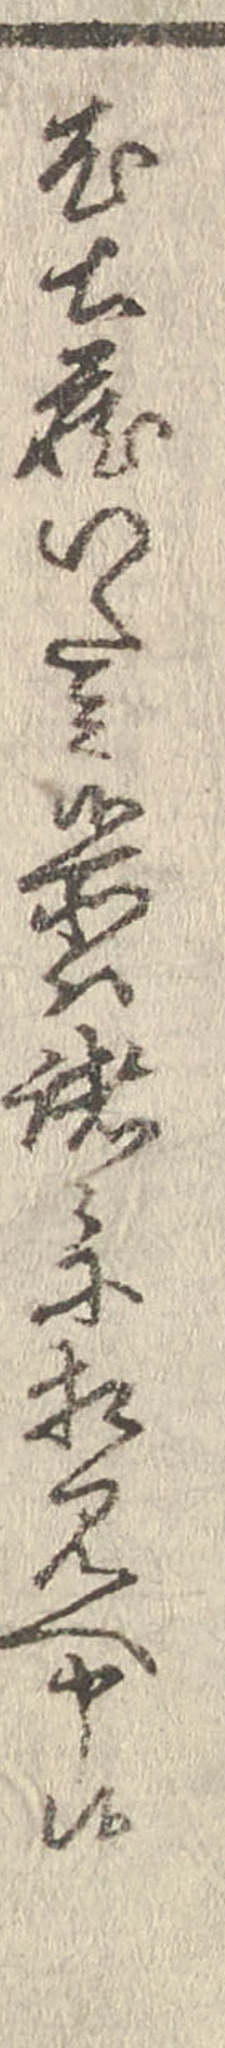尤土蔵いたミ候所ハ諸〻に相見へ申候
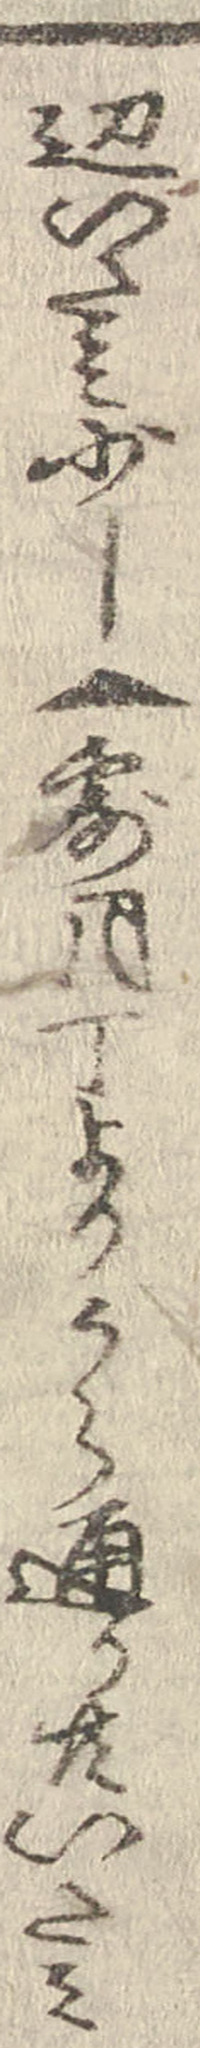辺いたミ少し▲露月丁よりうら通り共いたミ
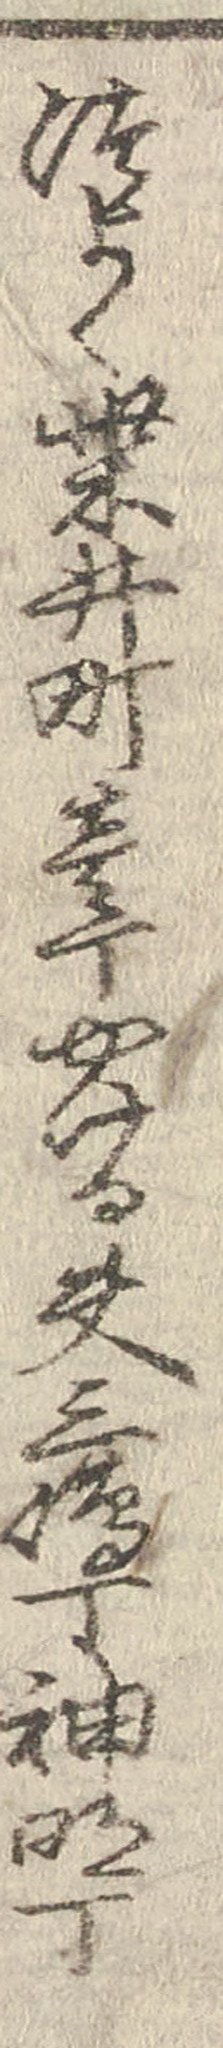つよく荒井町壱丁やける夫三嶋丁神明丁
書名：御江戸関八州大地震出火巨細記
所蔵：東京大学総合図書館 General Library in the University of Tokyo, JAPAN
